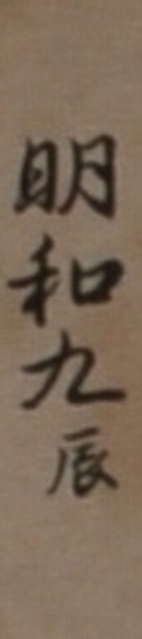明和九辰
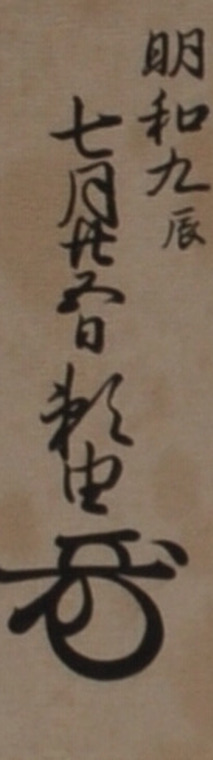七月廿五日頼由
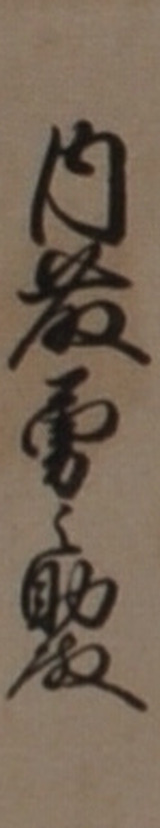内藤勇之助殿
